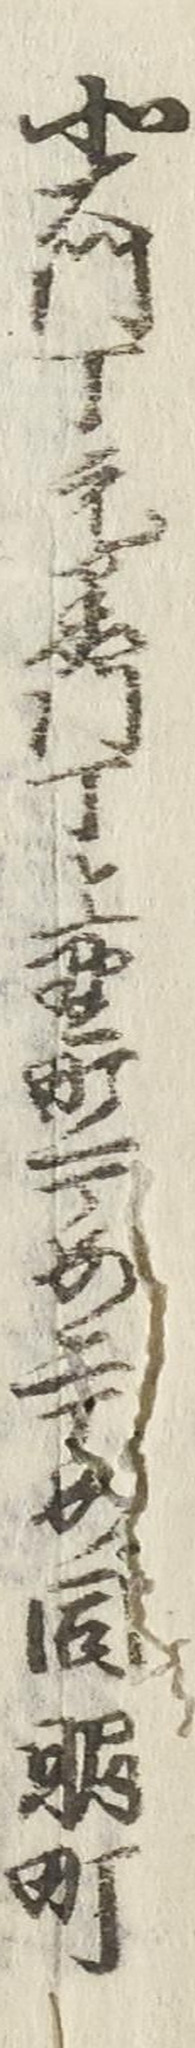北大門丁元黒門丁上野町一丁め二丁め同朋町
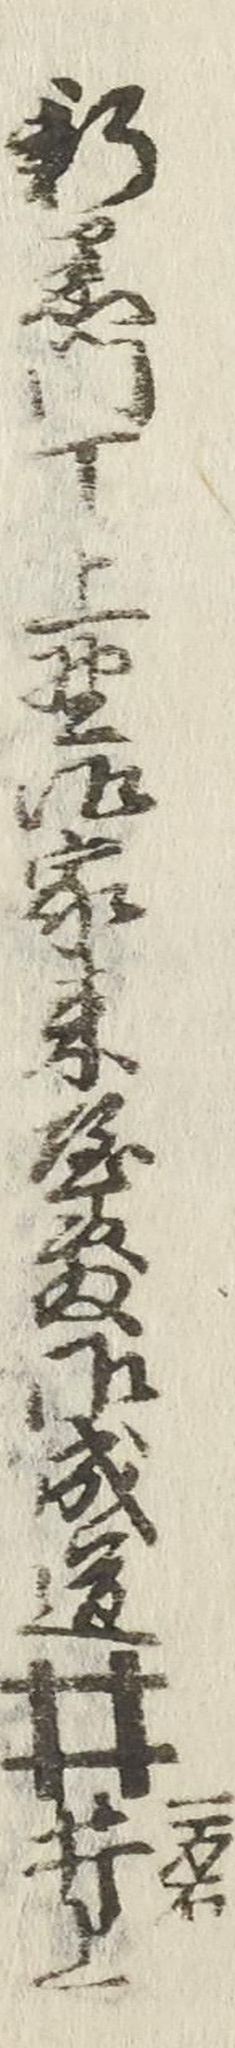新黒門丁上野家来屋敷御成道一万石井上
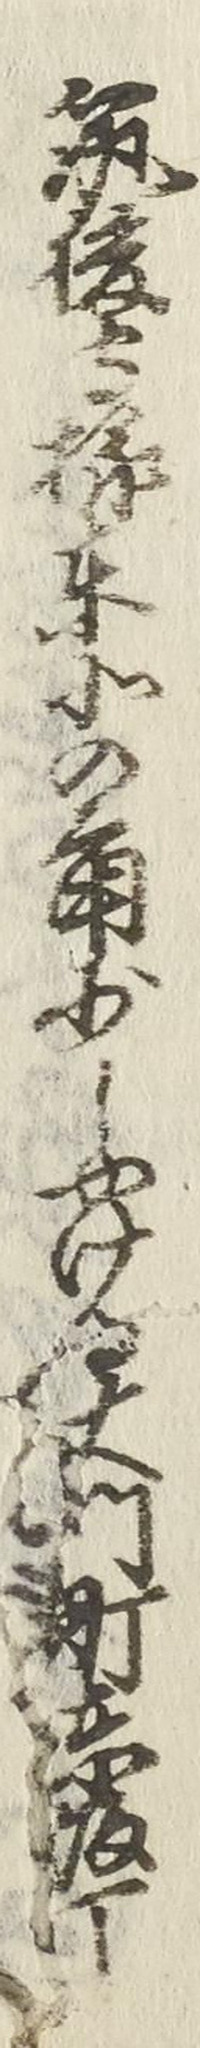築後守様東北の角少しやける大門町東坂丁
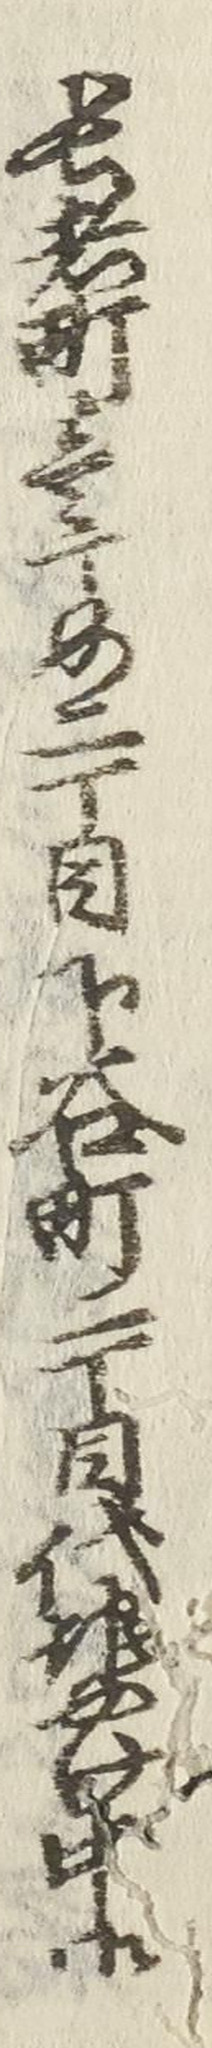長者町壱丁め弐丁目下谷町一丁目代地やけ申候
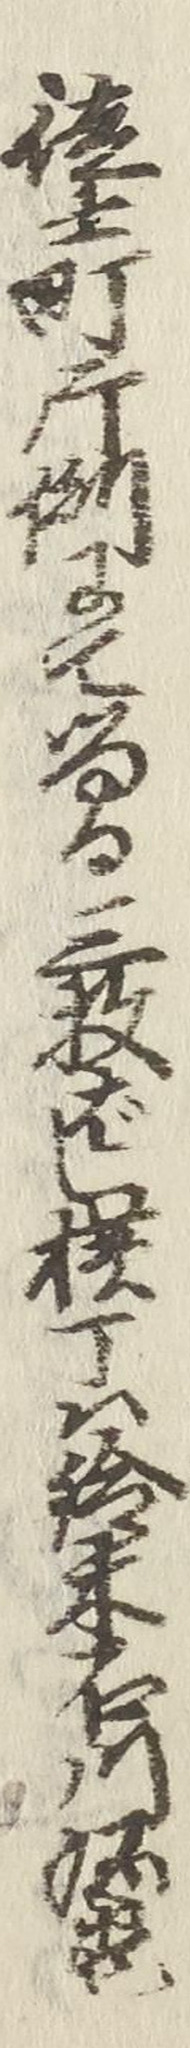徒士町片側にて留る三枚ばし横丁は鈴木石川酒巻
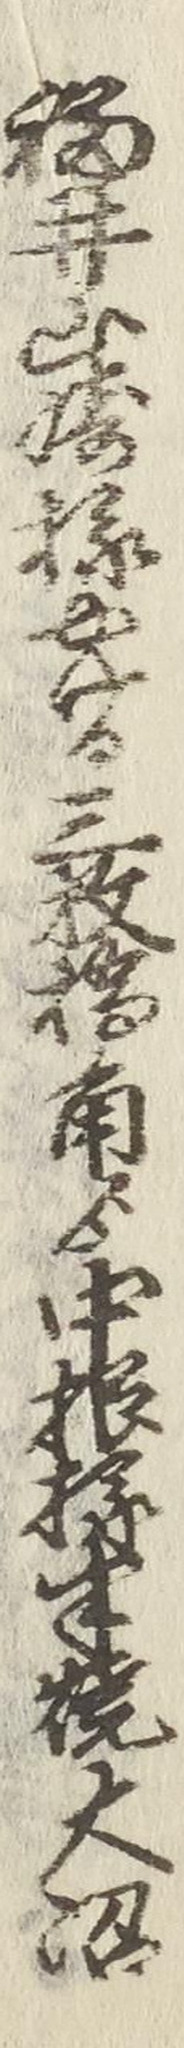福井山崎様やける三枚橋角ゟ中根様半焼大沼
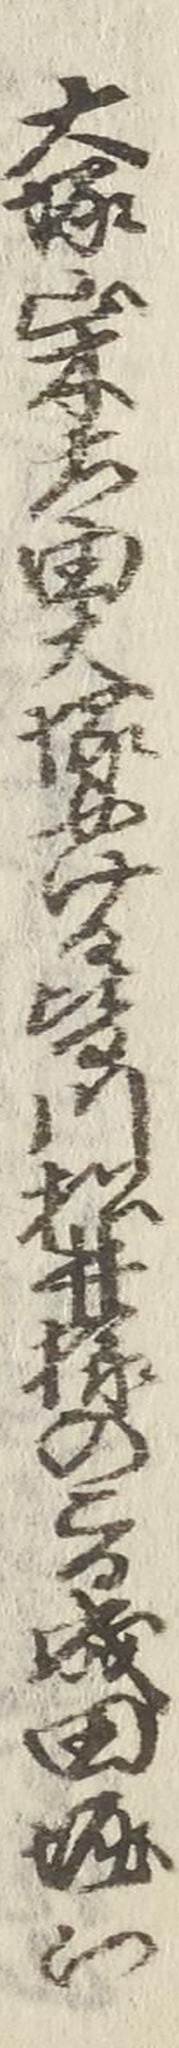大塚山本太田大塚やける皆川松井様のこる成田堀江
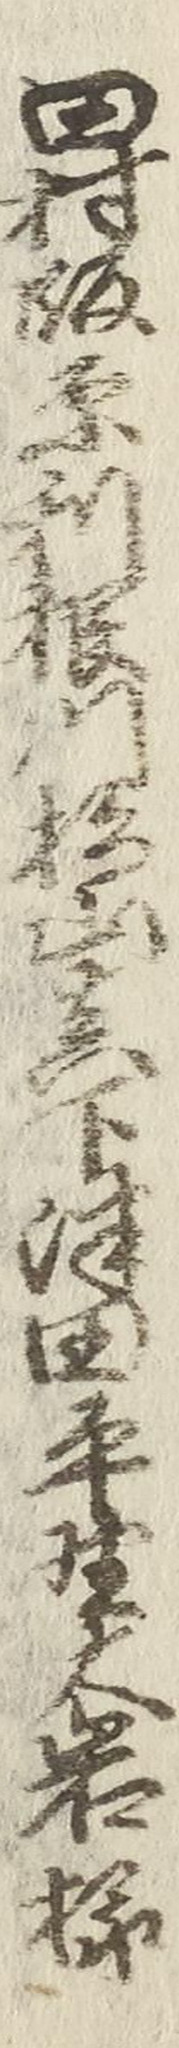田村飯原利根川坂山真下津田平野大岩様
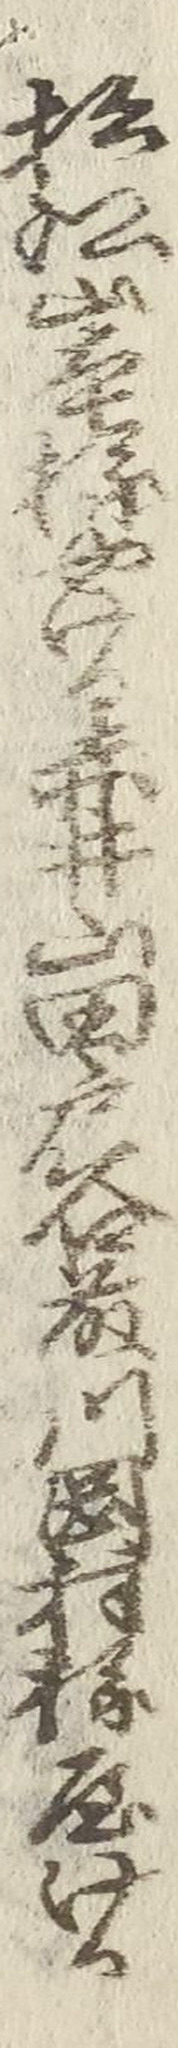杉江山本様やける赤井山田戸谷藤川岡村様やける
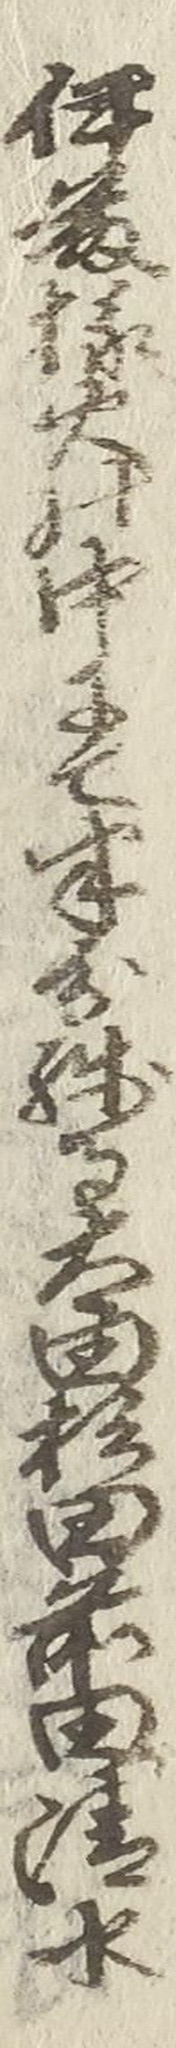伊東様火の中にて半分残る太田杉田前田清水
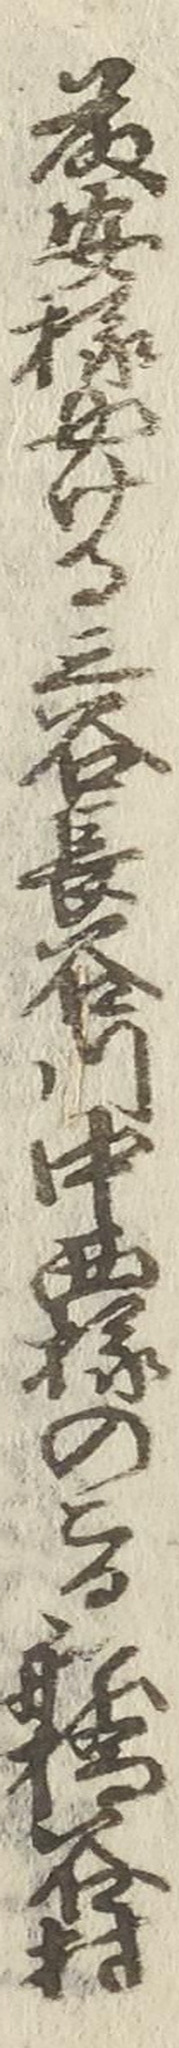藤安様やける三谷長谷川中西様のこる船橋谷村
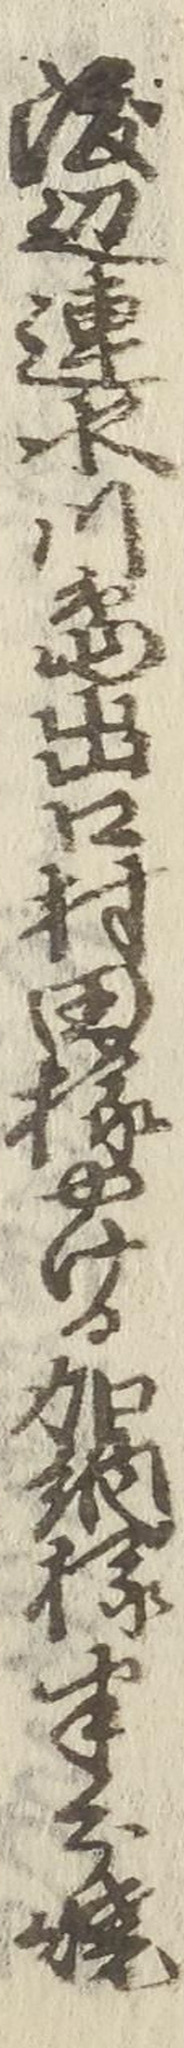渡辺速水川嶋出口村田様やける加納様半分焼

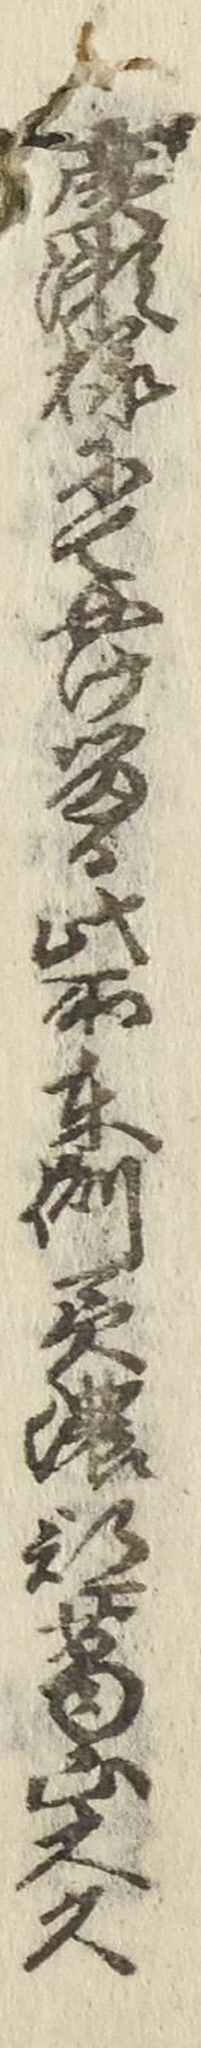広瀬様にてやけ留る此所東側美濃部葛山大久
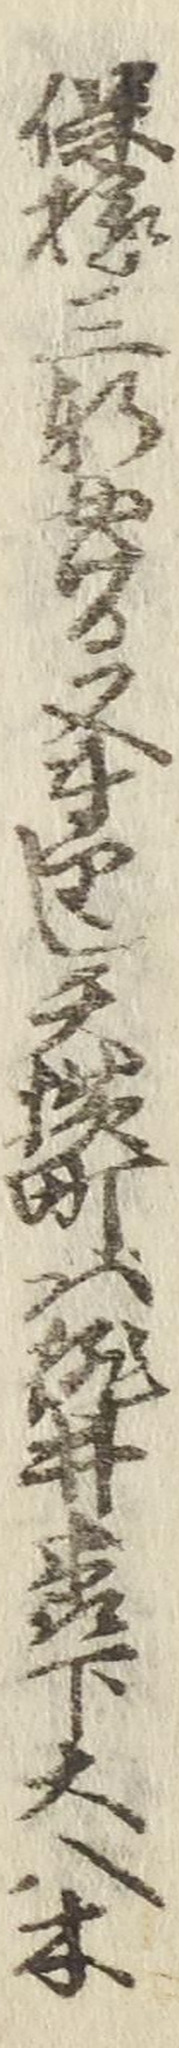保様三軒やける又まりし天横町は桃井森下大八木
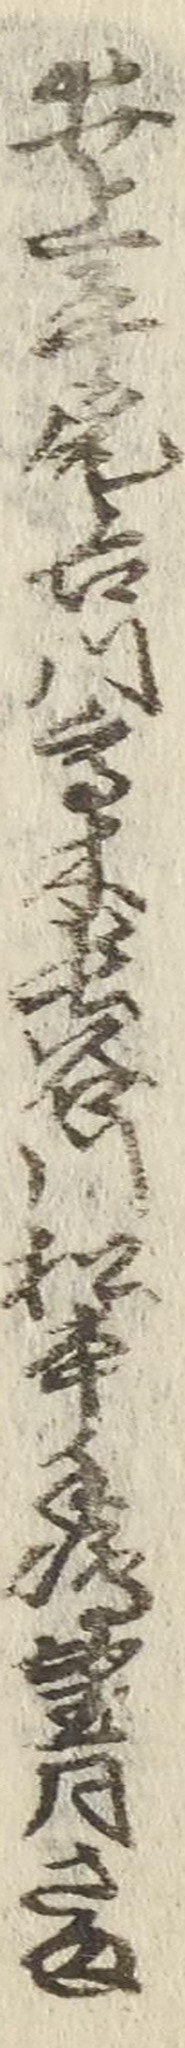井上平尾吉川高木長谷川松本舟嶋望月さま
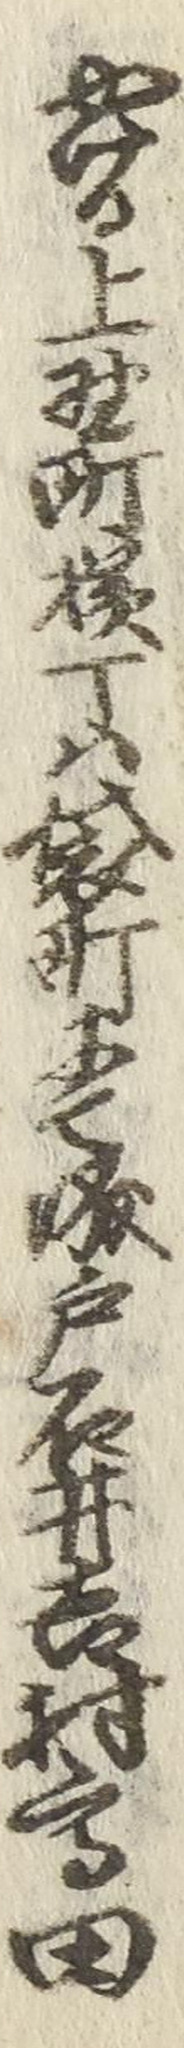やける上野町横丁は袋町にて城戸石井吉村高田
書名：地震出火　男女死人怪我人書上之寫
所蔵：東京大学地震研究所図書室 Earthquake Research Institute Library, The University of Tokyo, JAPAN
